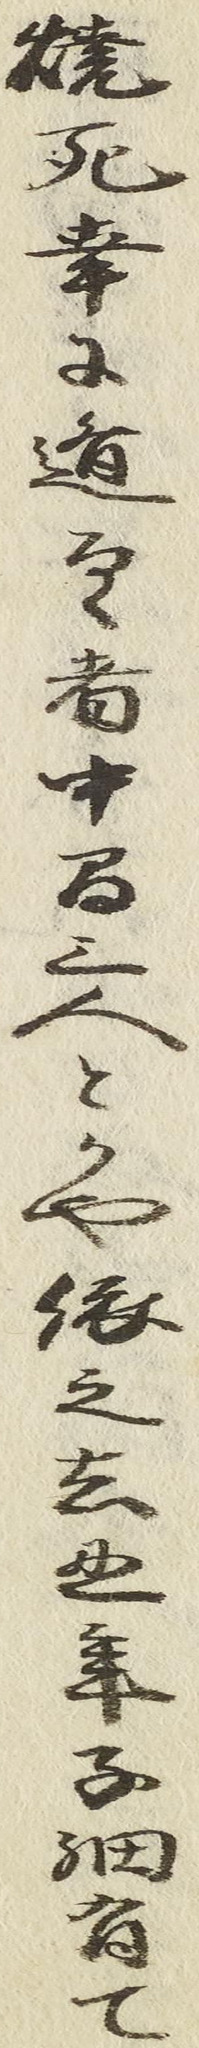焼死幸に遁るゝ者中間三人とかや依之去丑年子細有て
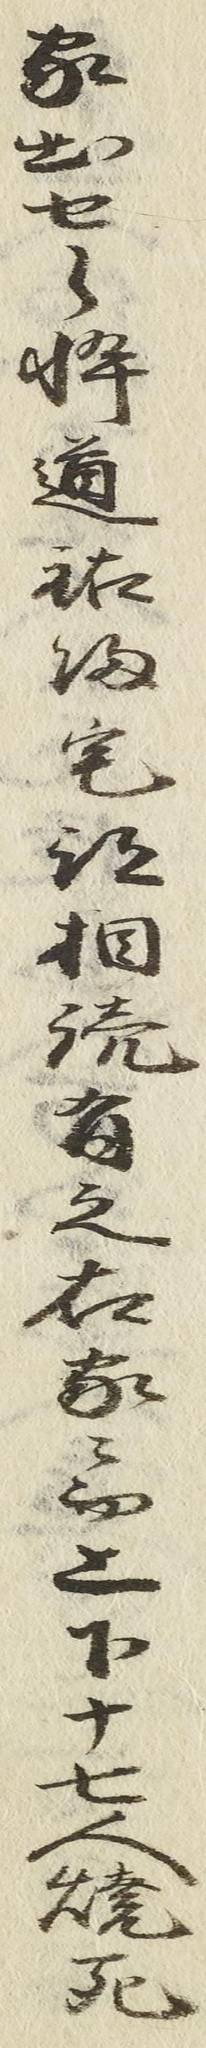家出セし悴道祐帰宅跡相続有之右家ニ而上下十七人焼死
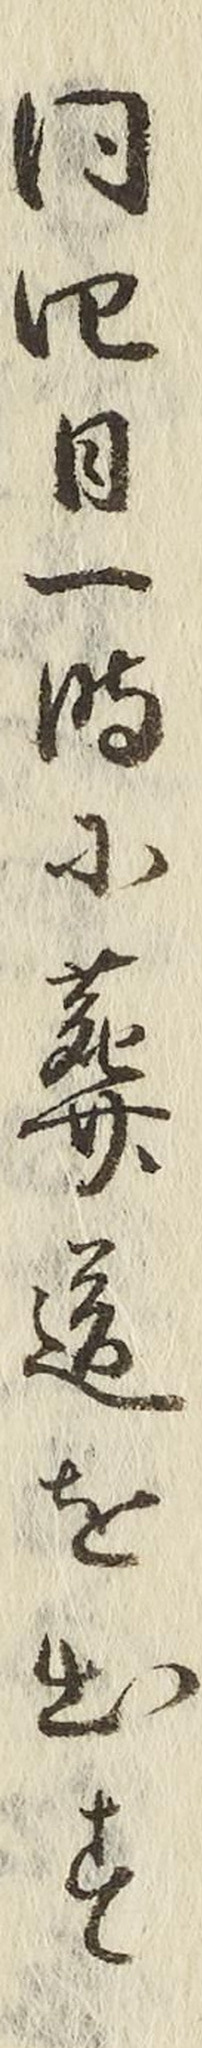同四日一時に葬送を出す
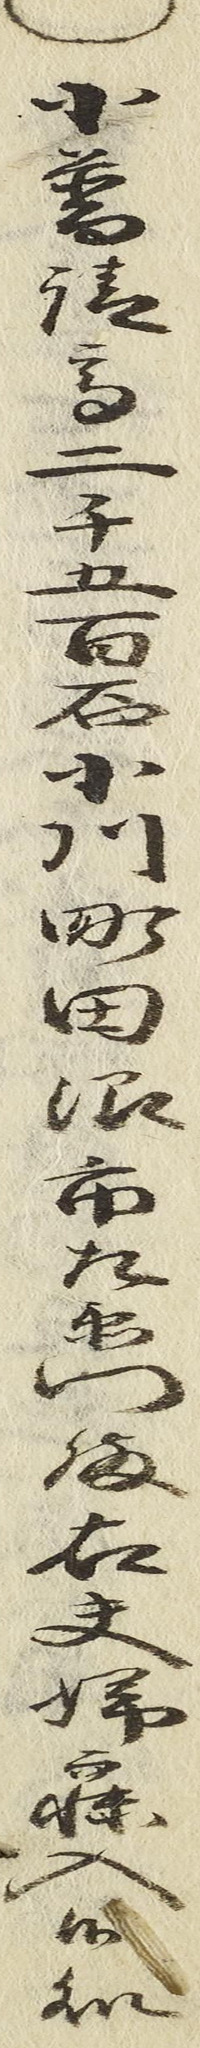○小普請高二千五百石小川町田沼市左衛門殿右夫婦寝入候処
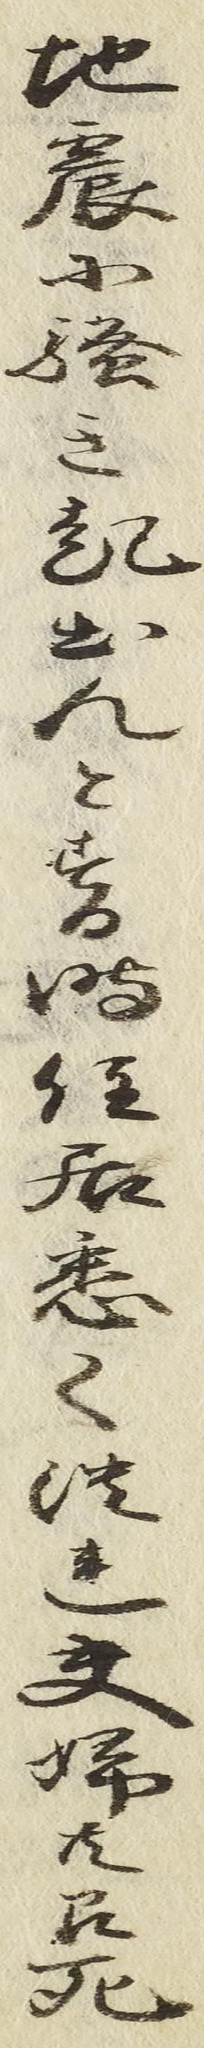地震に騒き起出んとする時住居悉く潰れ夫婦共即死
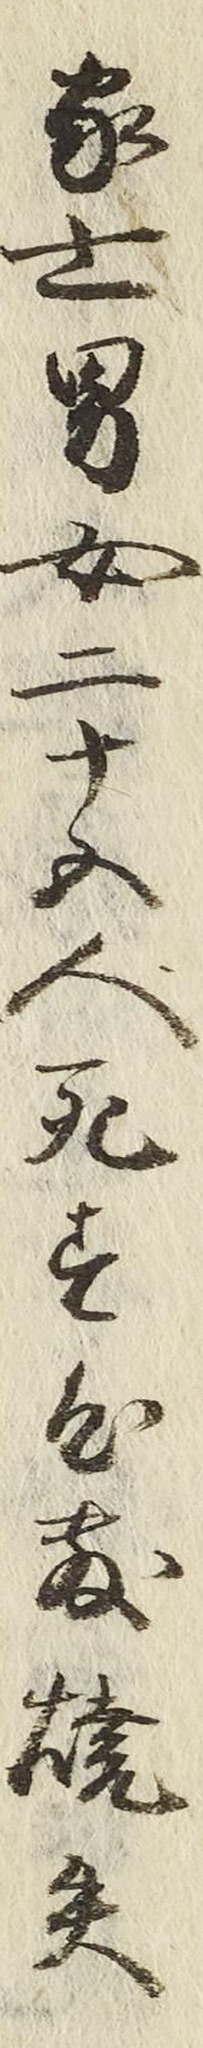家士男女二十五人死す屋敷焼失
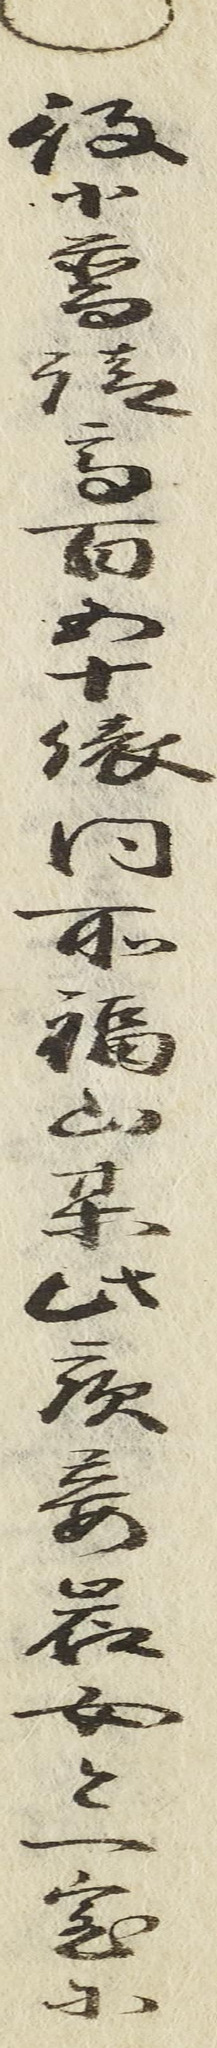○役小普請高百五十俵同所福山某此夜妾岩女と一室に
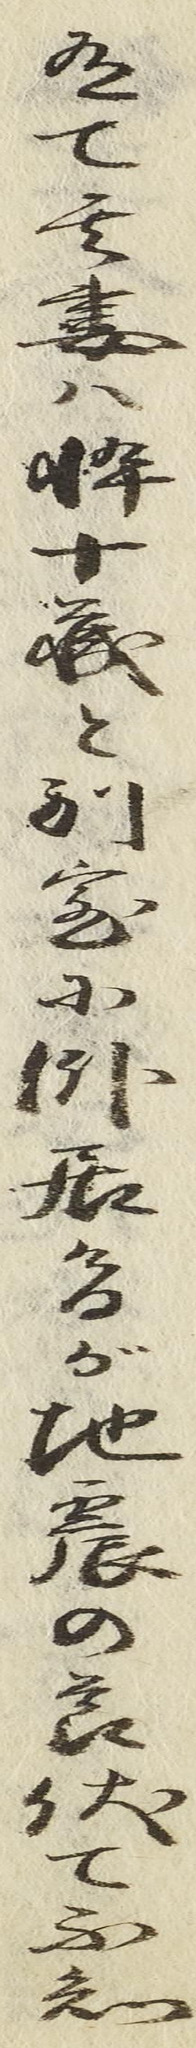有て其妻は悴十蔵と別室に臥居けるが地震の節伏て不知
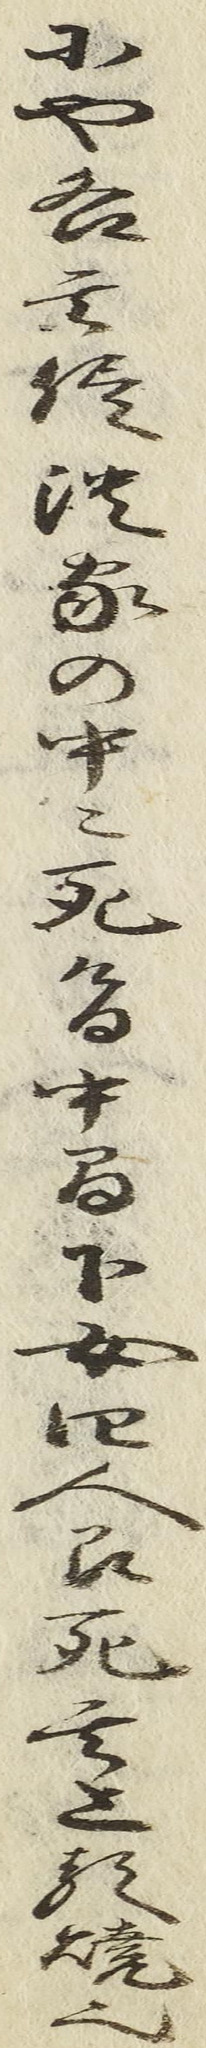にや各其侭潰家の中ニ死ける中間下女四人即死其上類焼也
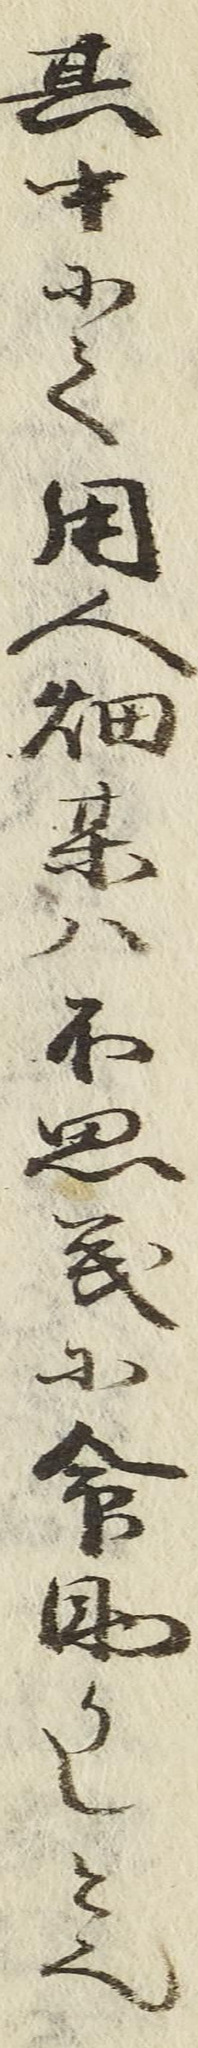其中にて用人畑某は不思義に命助りしと也
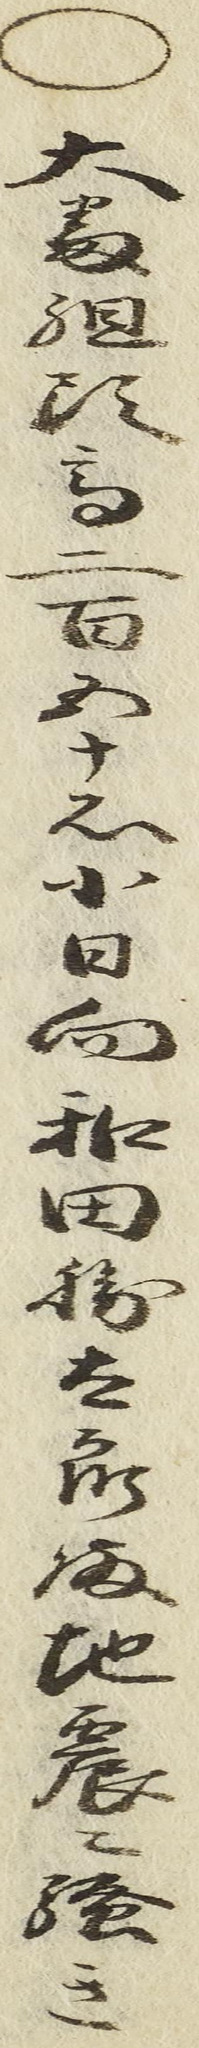○大番組頭高二百五十石小日向和田勝太郎殿地震ニ騒き
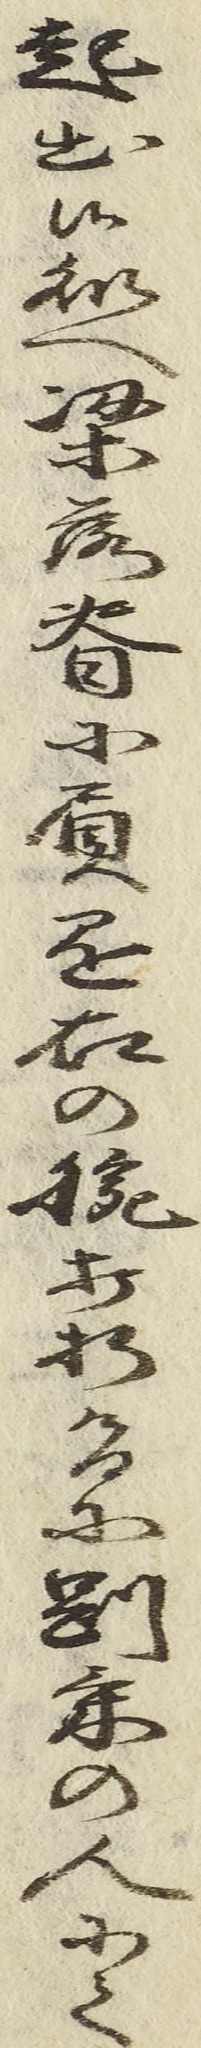起出候処へ梁落脊に負懸右の腕打折けるに剛気の人にて
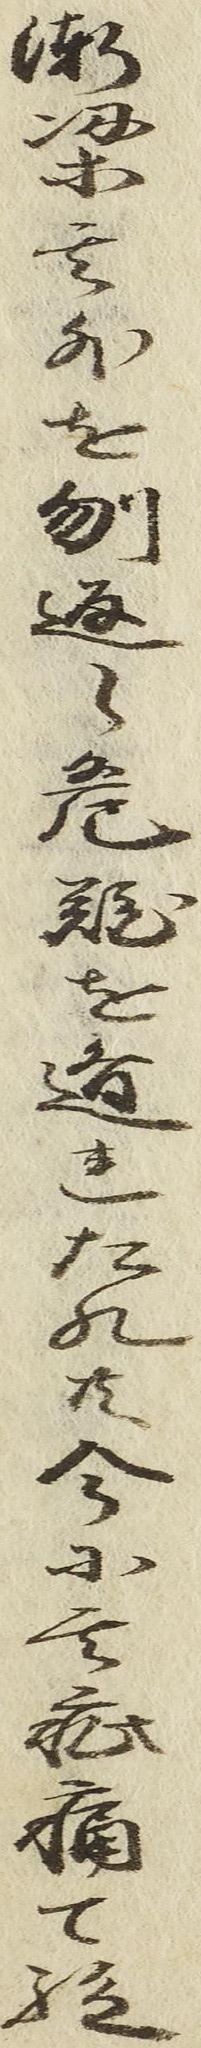漸梁其外を刎返し危難を遁れたれ共今に其疵痛て絶

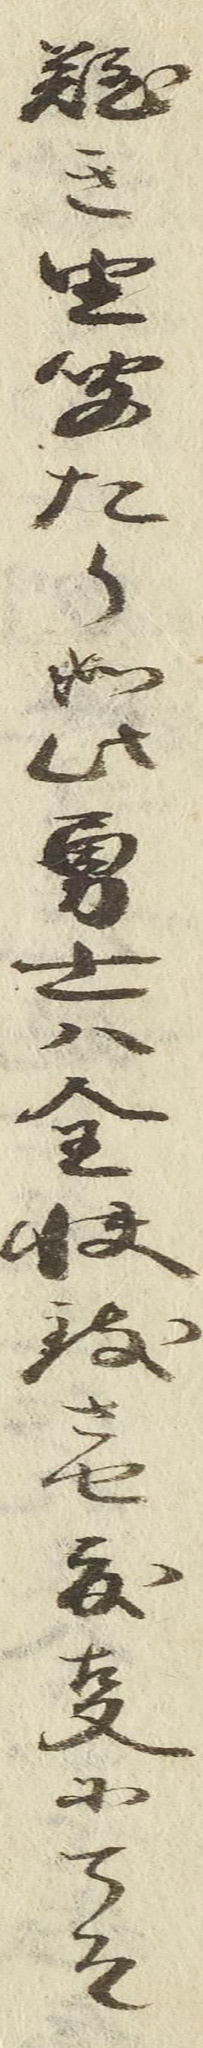難き由聞たり如此勇士は全快致さセ度事にてそ
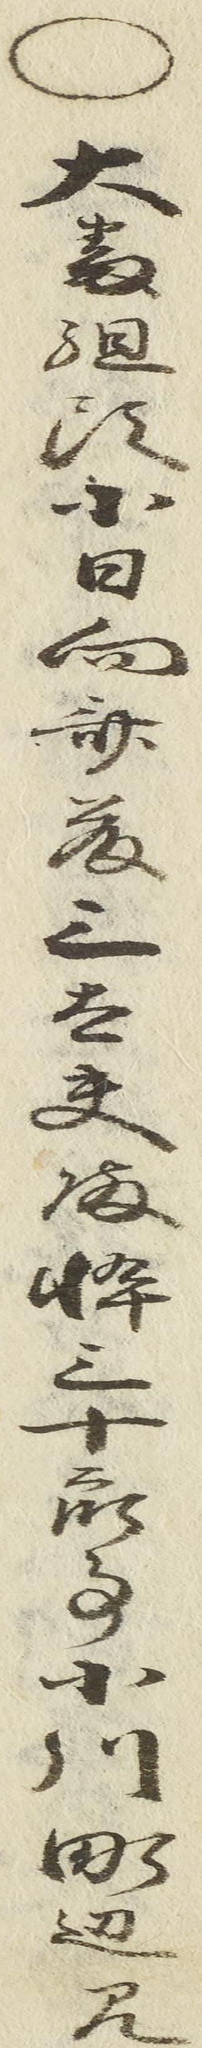○大番組頭小日向斎藤三太夫殿悴三十郎事小川町辺見
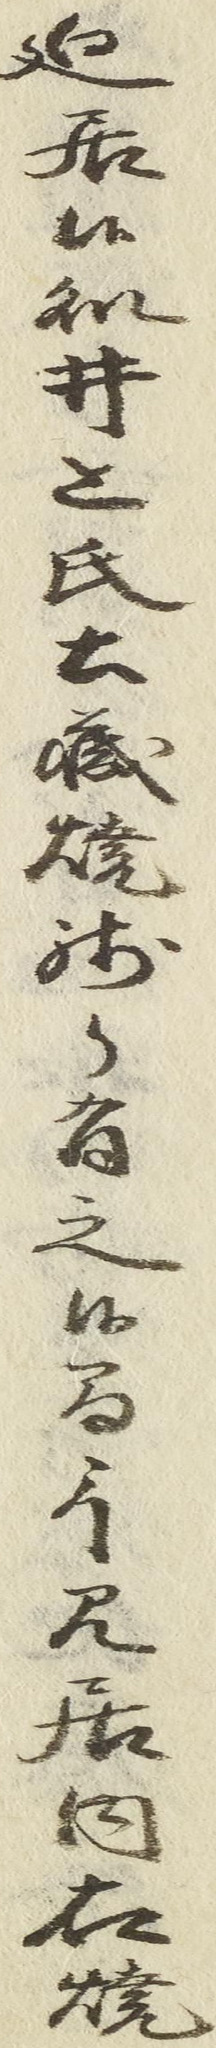廻居候処井上氏土蔵焼残り有之候間彳見居内右焼
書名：安政二年震災記事　完
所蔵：東京大学地震研究所図書室 Earthquake Research Institute Library, The University of Tokyo, JAPAN
